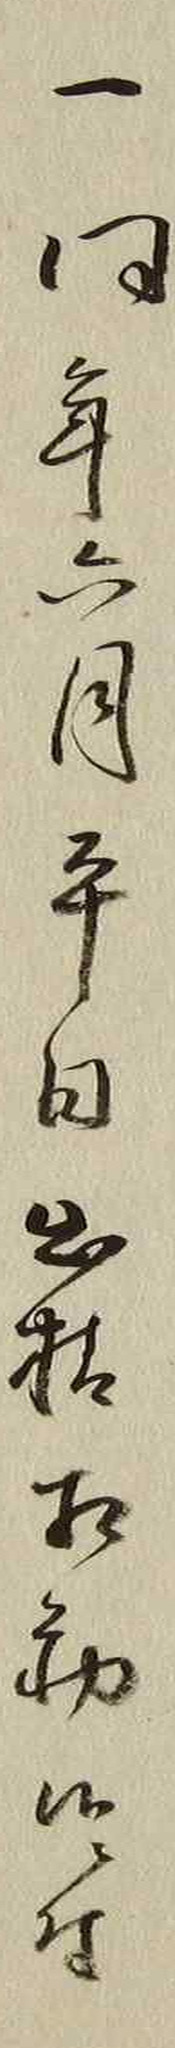一同年六月平日出精相勤候ニ付
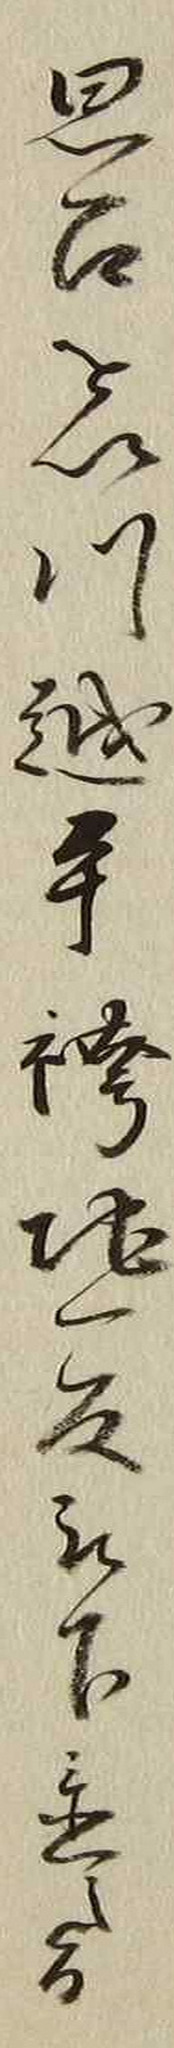思召を以川越平袴地一反被下置之旨
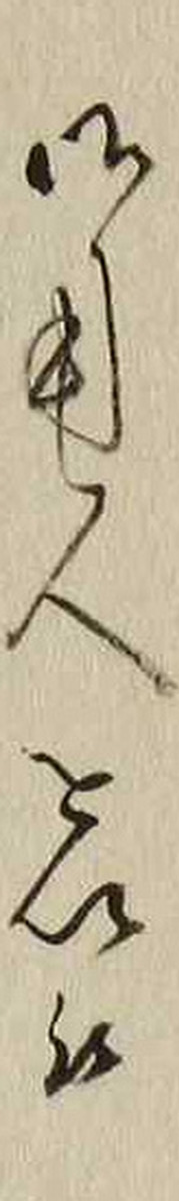御用人を以被
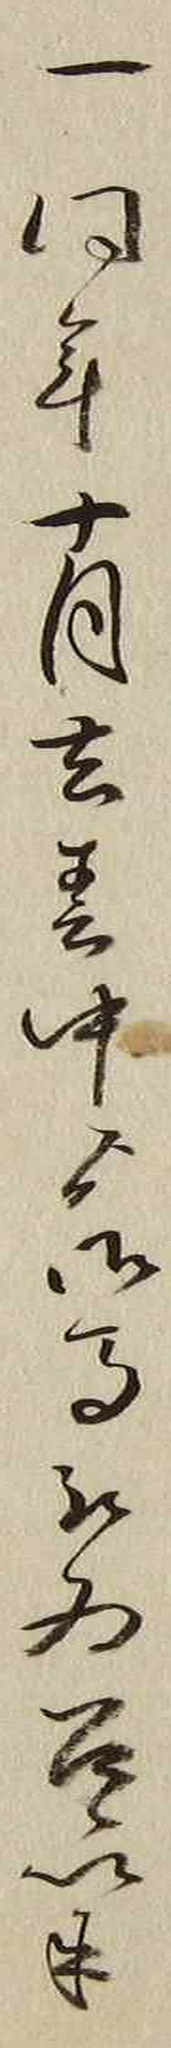一同年十月去春中ゟ御馬被為召候以来
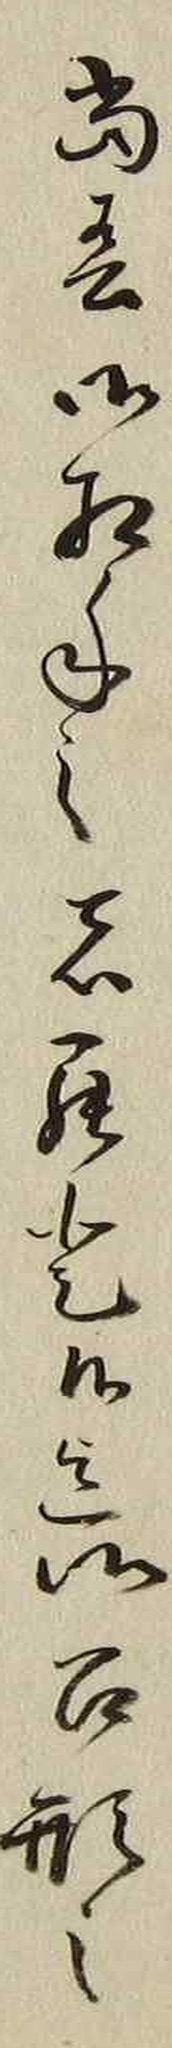当春御相手之者罷登候迄以召形之
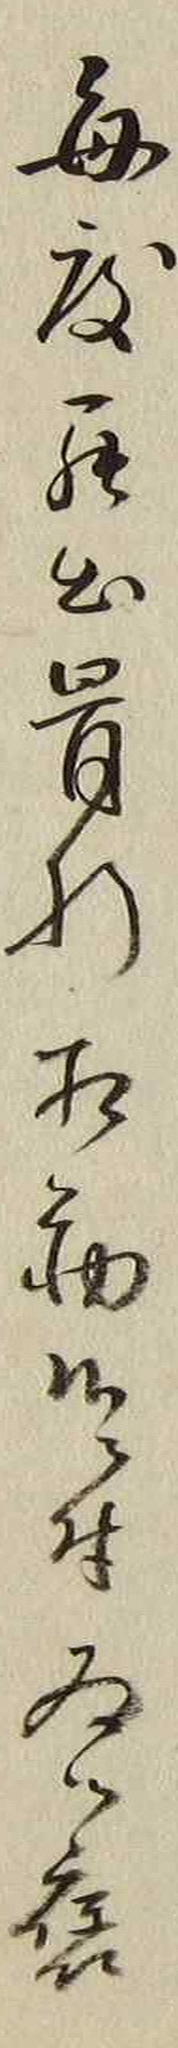毎度罷出骨折相勤候ニ付為御褒
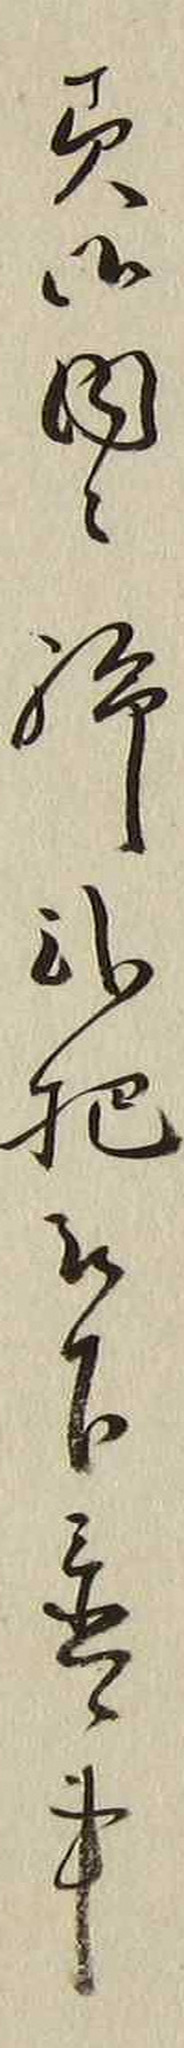美御内々綿弐把被下置候事
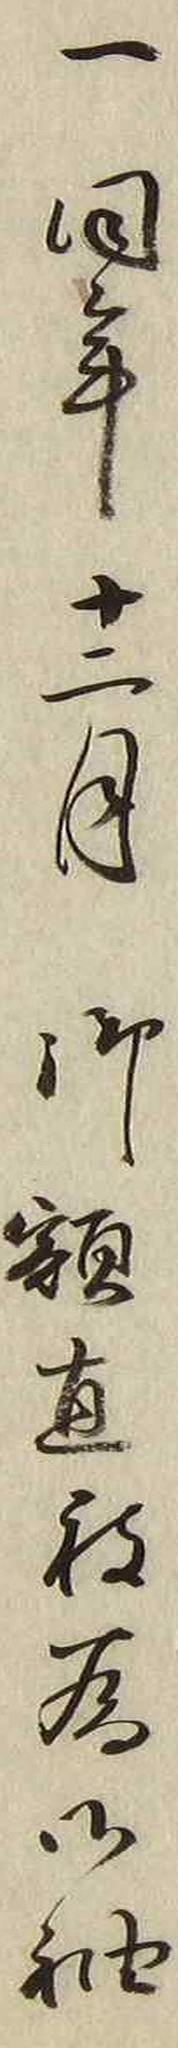一同年十二月御額直被為御袖
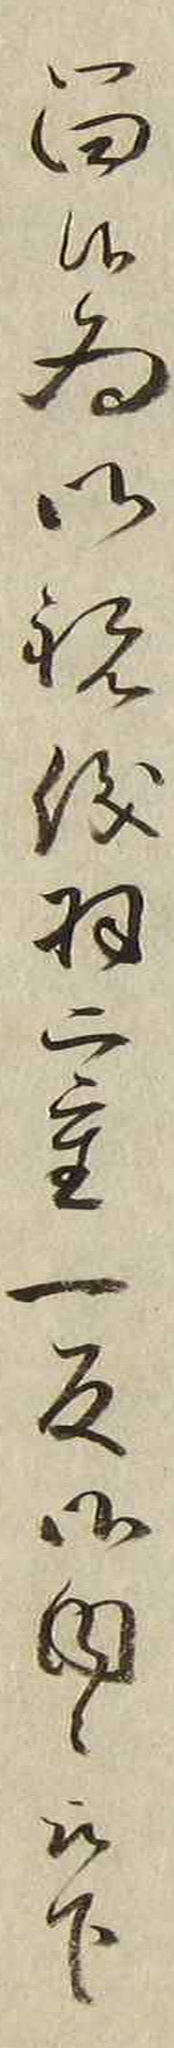留候為御祝儀羽二重一反御内々被下

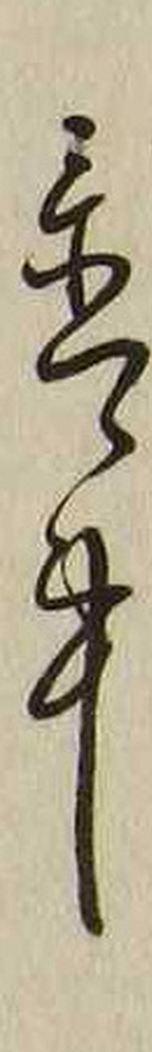置候事
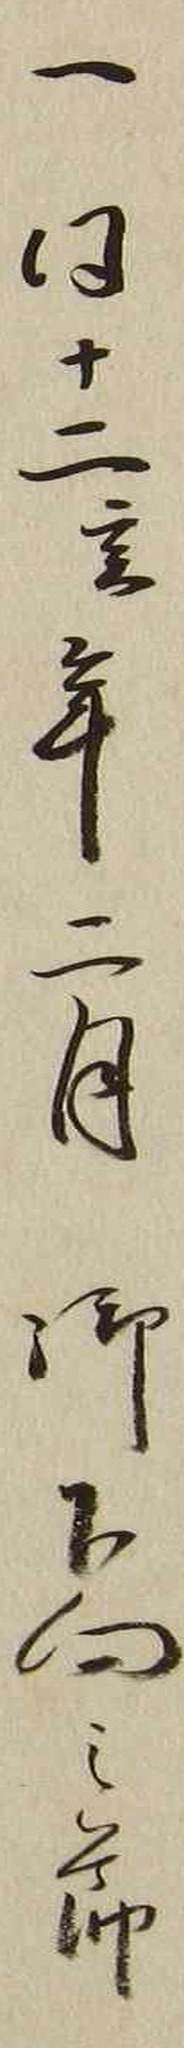一同十二亥年二月御下向之節
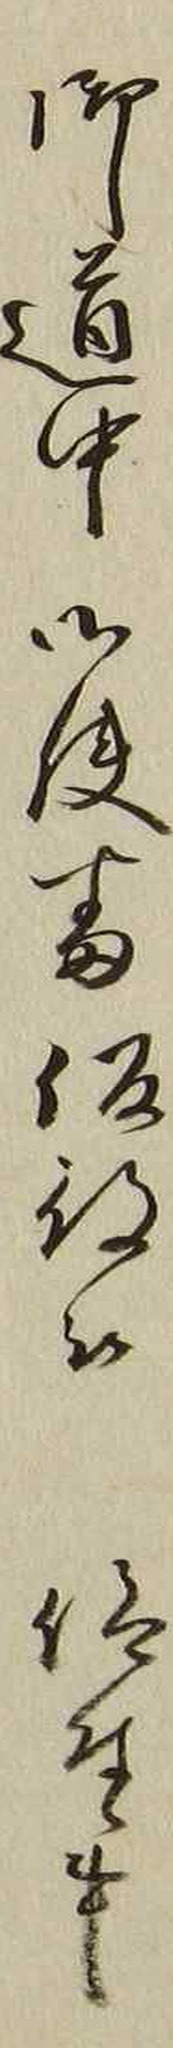御道中御使番仮役被仰付候事
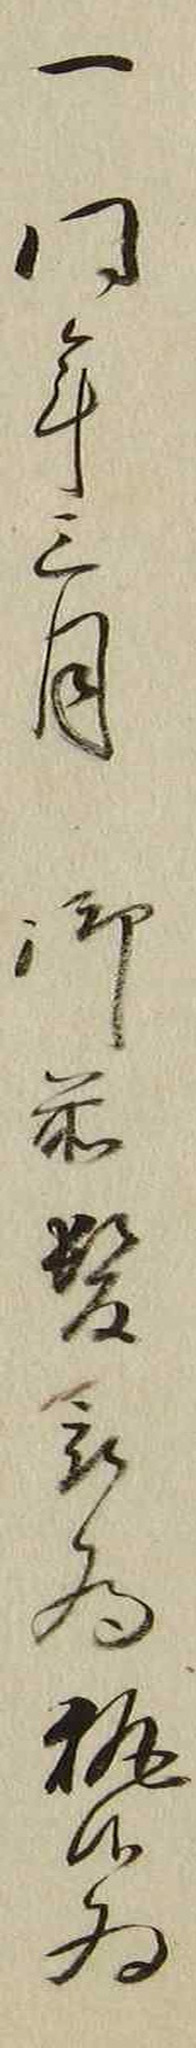一同年三月御前髪被為執候為
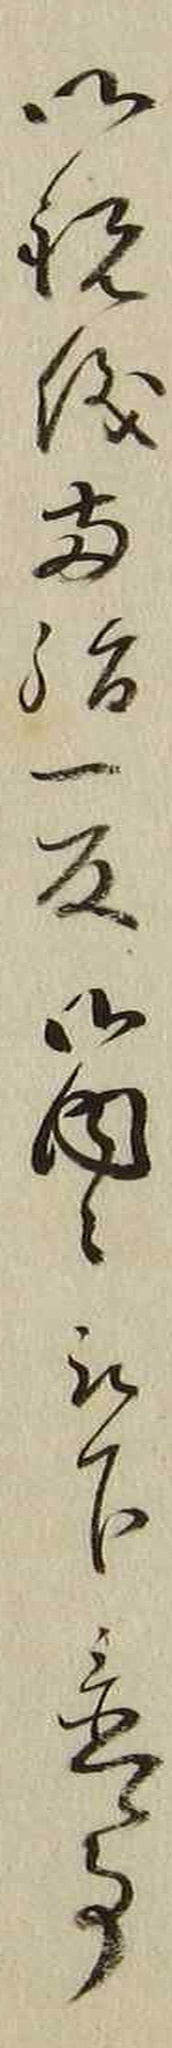御祝儀両絹一反御内々被下置候事
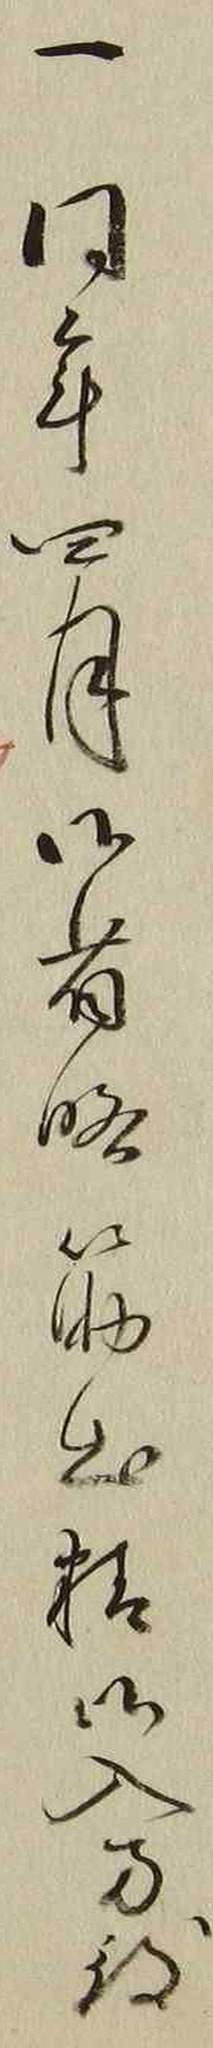一同年四月御省略筋出精御入方致
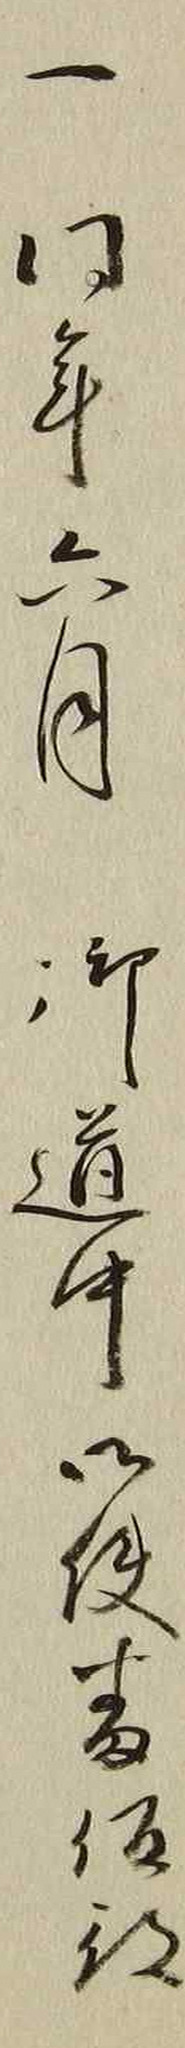一同年六月御道中御使番仮役
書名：諸士系譜　巻之25　い之部25
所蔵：会津若松市立会津図書館
